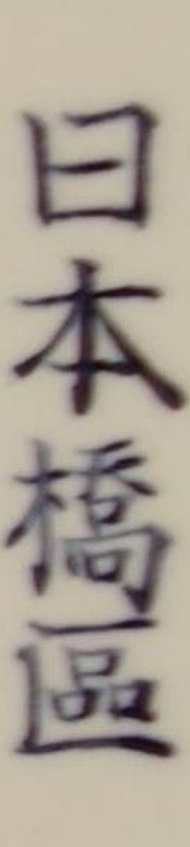＠日本橋区
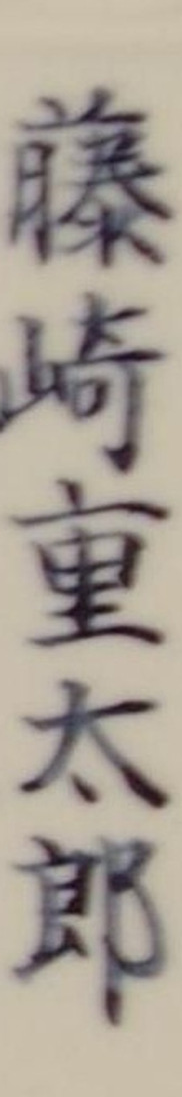藤崎重太郎
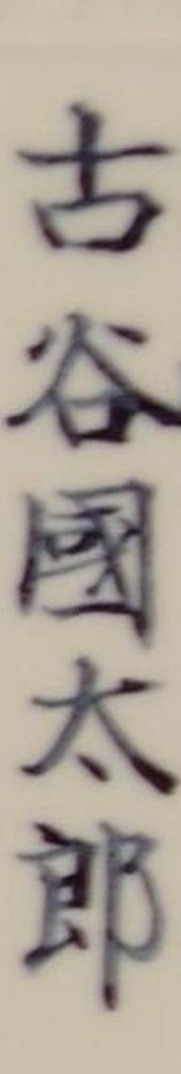古谷国太郎
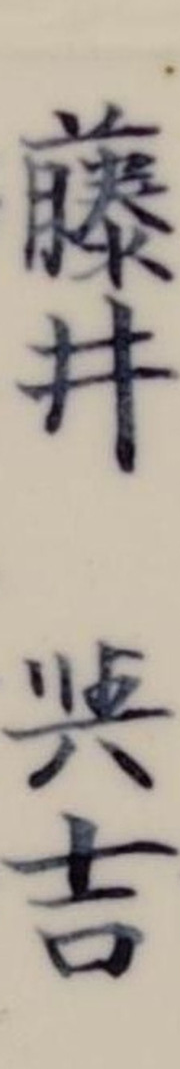藤井與吉
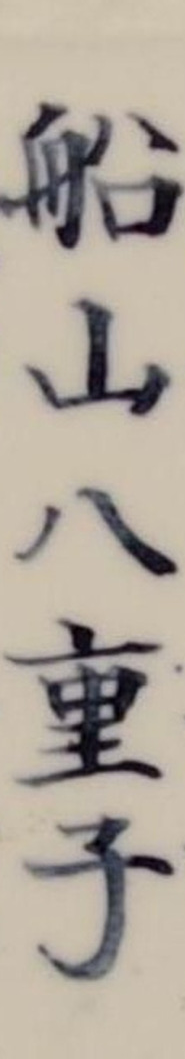船山八重子
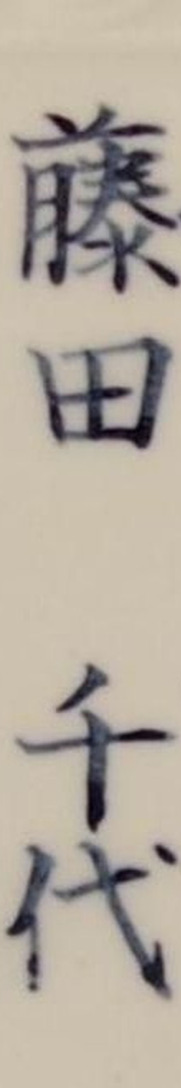藤田千代
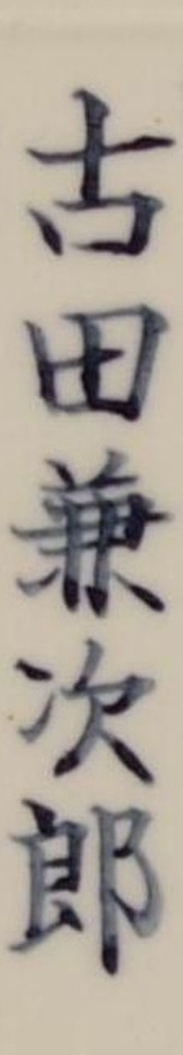古田兼次郎
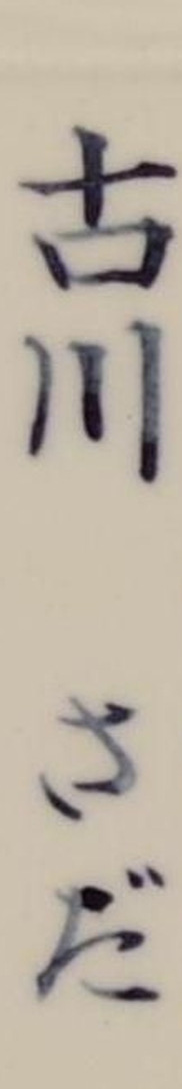古川さだ
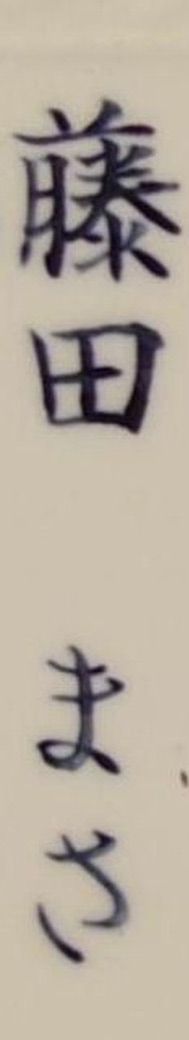藤田まさ
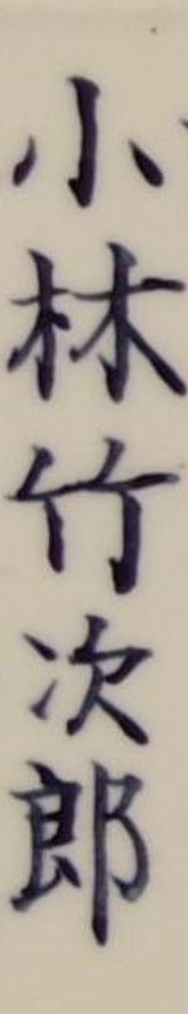小林竹次郎
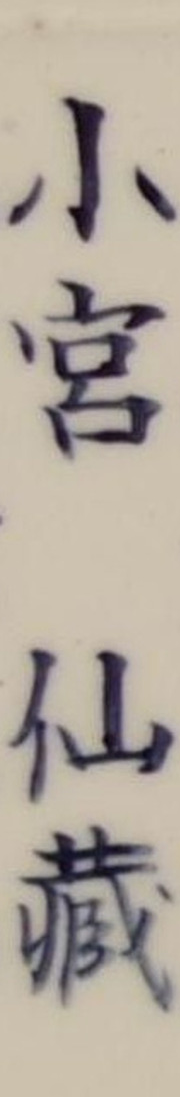小宮仙蔵
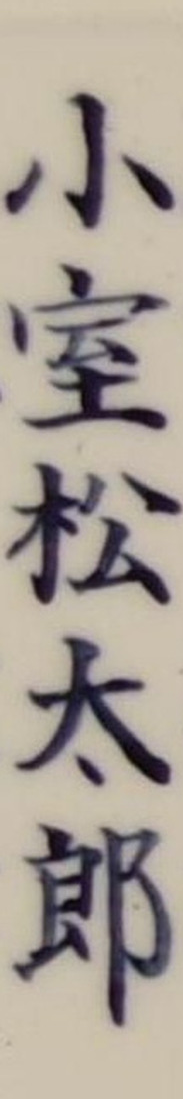小室松太郎
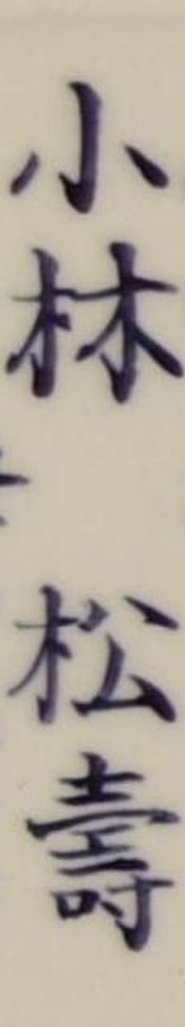小林松壽
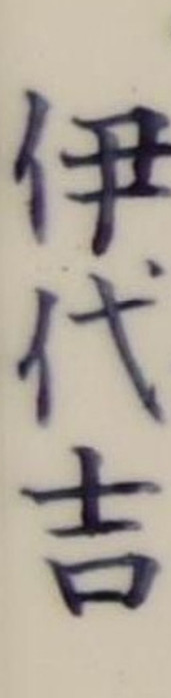伊代吉

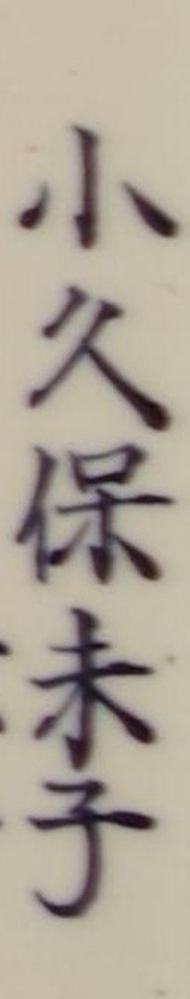小久保未子
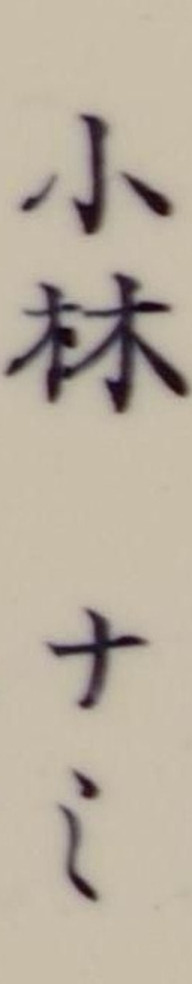小林ナミ
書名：E~L
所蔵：高野山金剛峯寺
